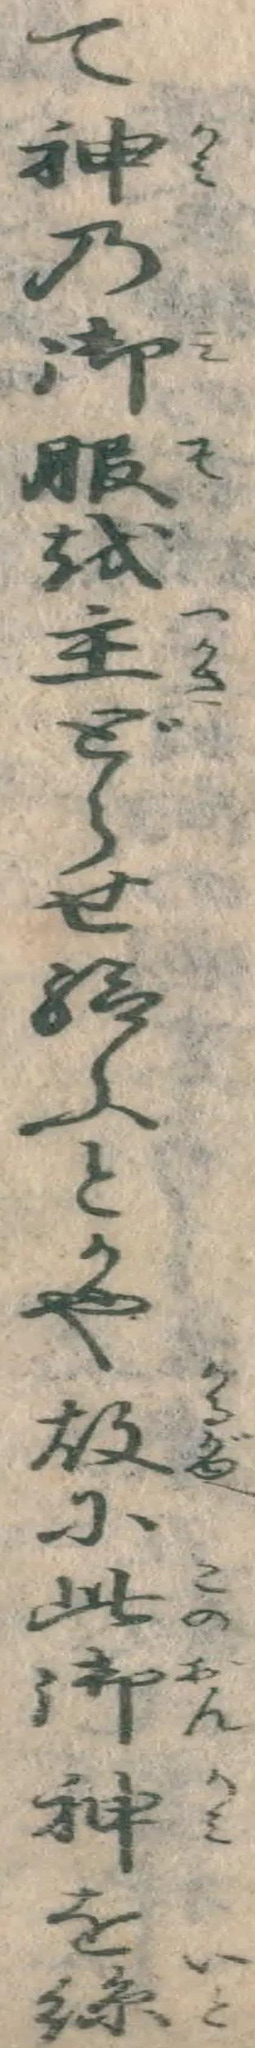て神の御服を主どらせ給ふとかや故に此御神を糸
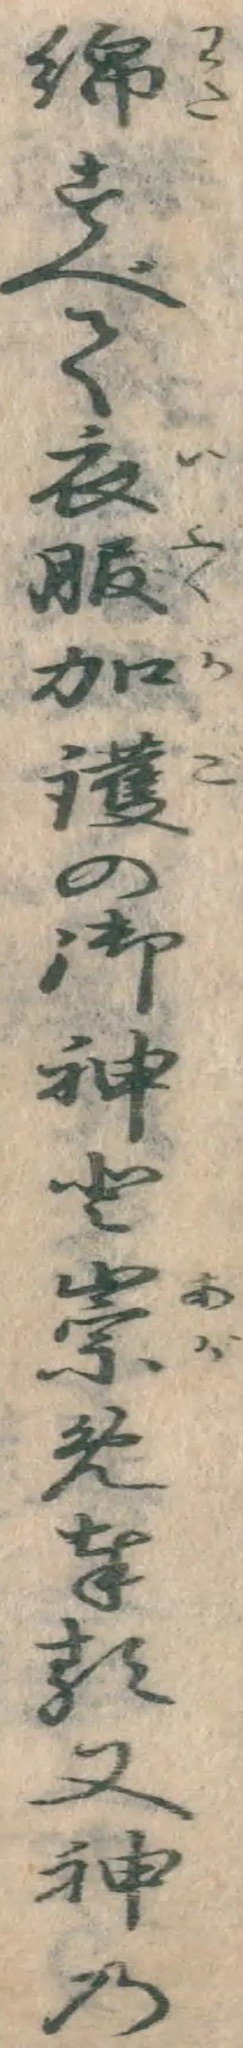綿すべて衣服加護の御神と崇め奉る又神の

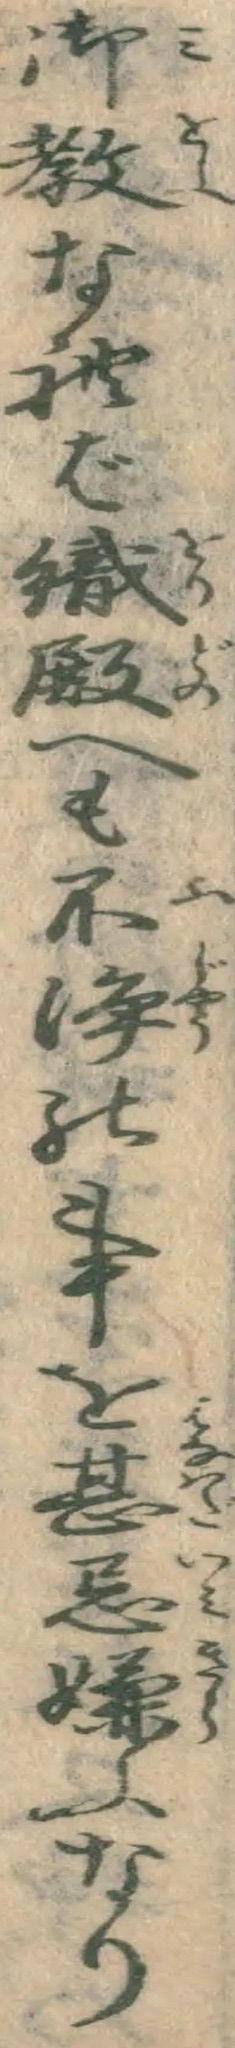御教なれば織殿へも不浄の事を甚忌嫌ふなり
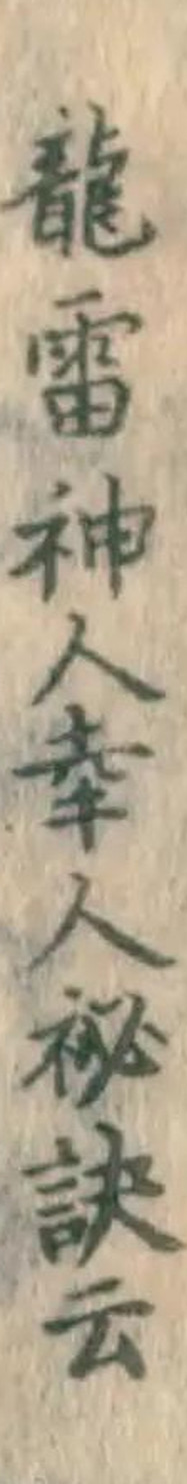龍雷神人幸人秘訣云
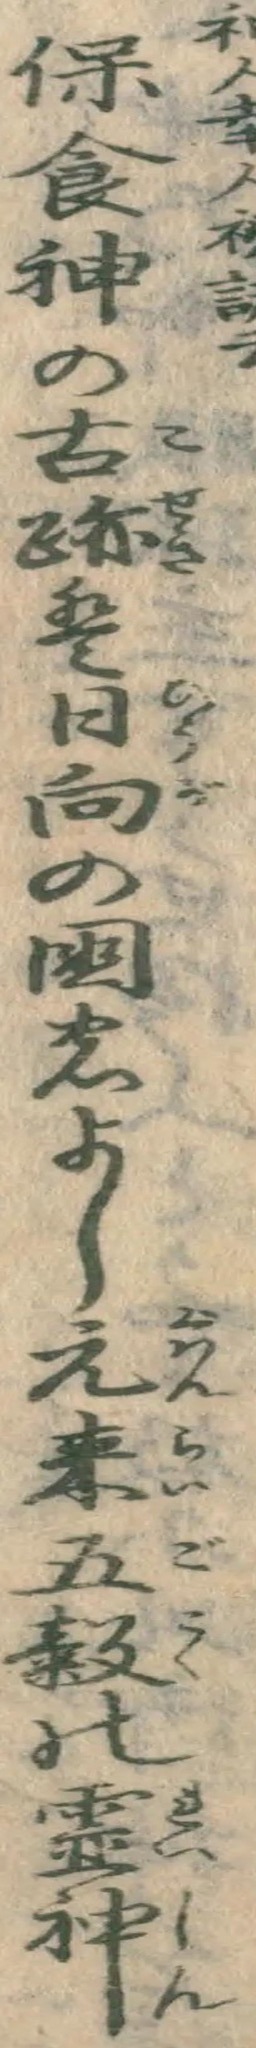保食神の古跡は日向の国のよし元来五穀の霊神
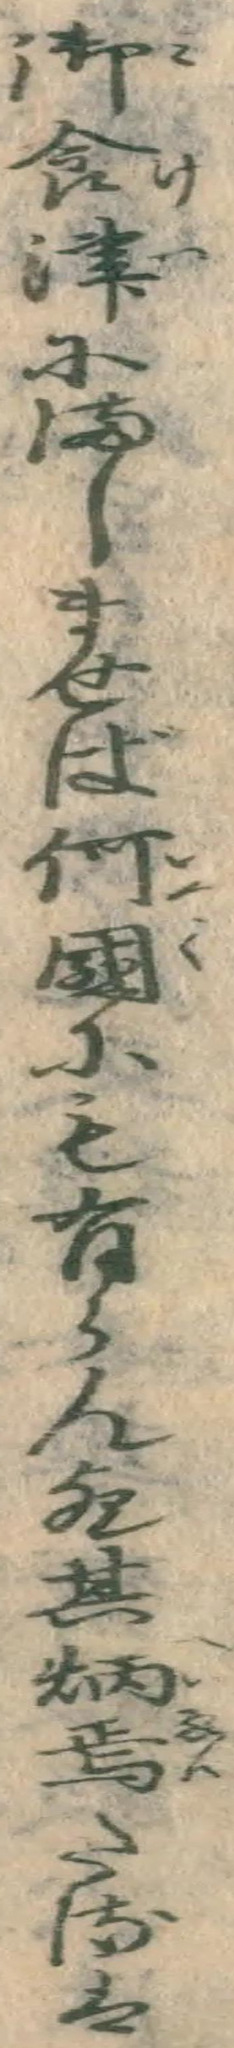御食津にましませば何国にも有らん歟其炳焉たるは
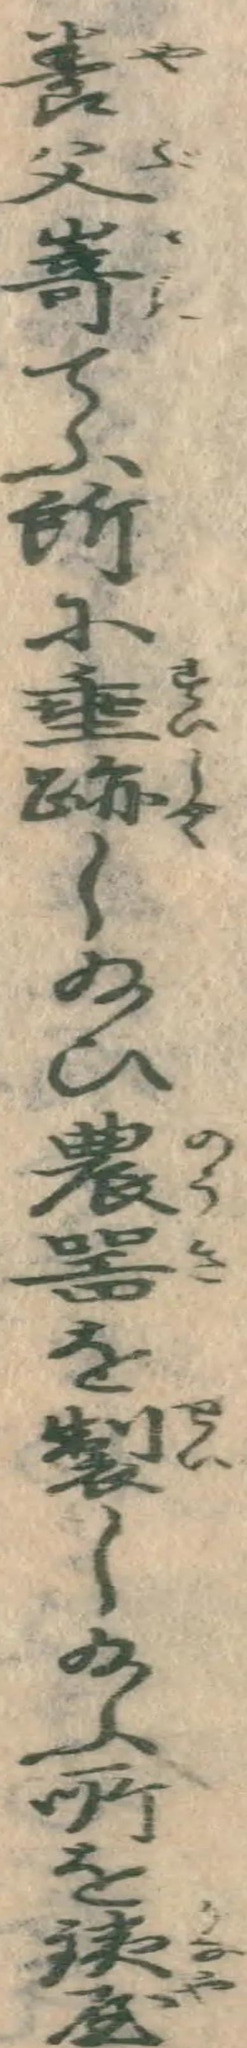養父崎てふ所に垂跡し給ひ農器を製し給ふ所を銕屋
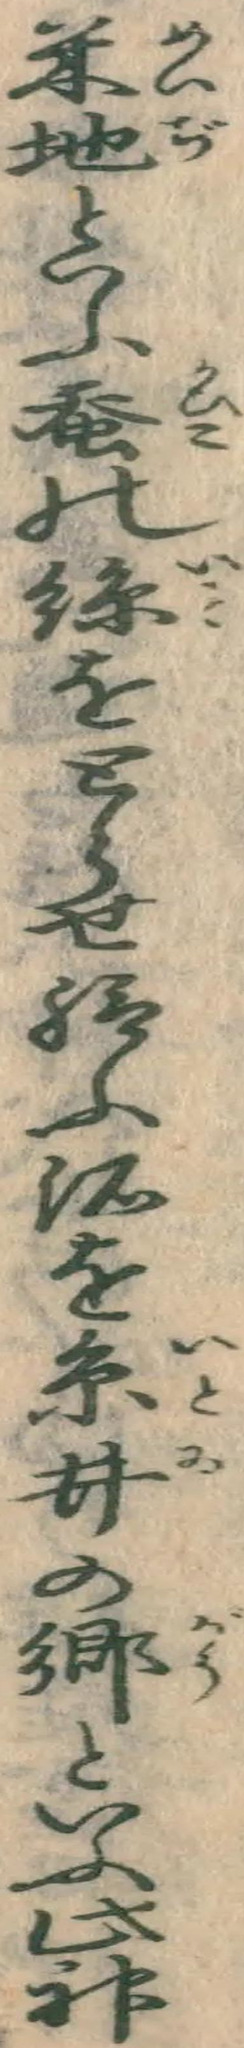米地といふ蚕の糸をとらせ給ふ所を糸井の郷といふ此神
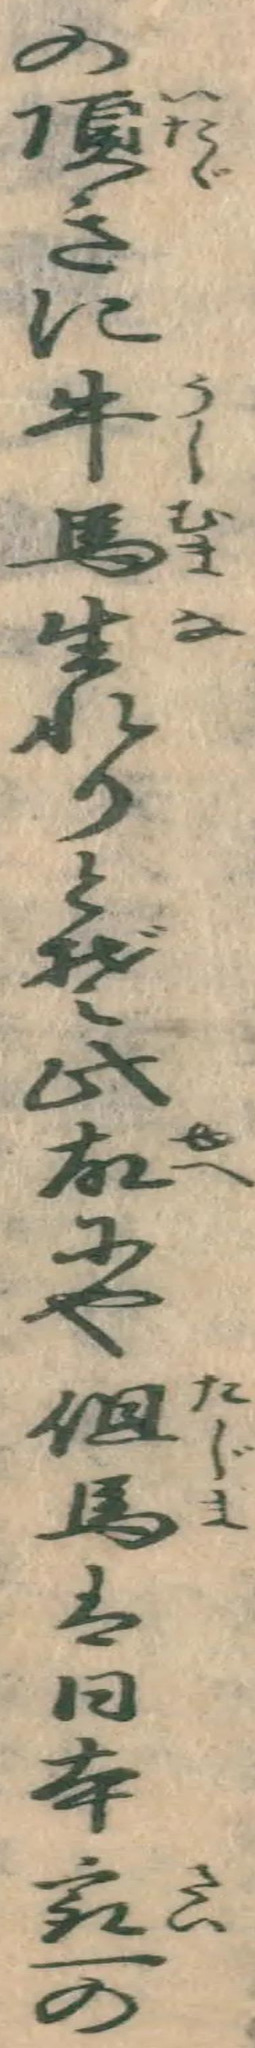の頂きに牛馬生れりとぞ此故にや但馬は日本最一の
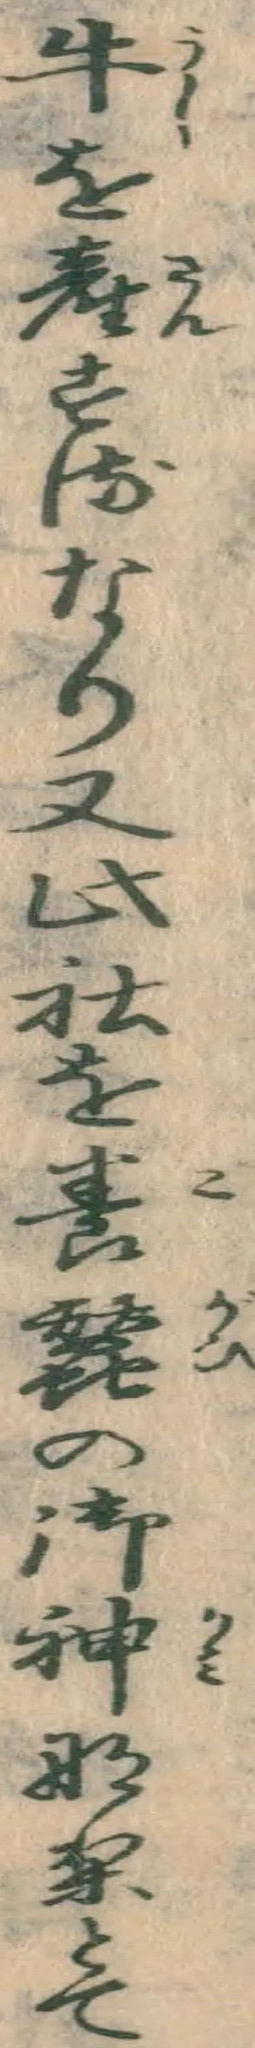牛を産するなり又此社を養蚕の御神なりとて
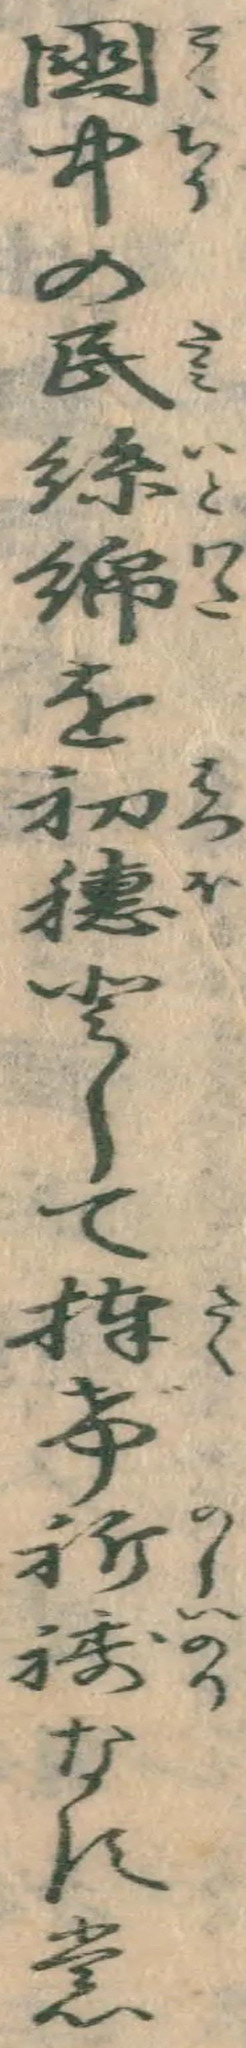国中の民糸綿を初穂として捧げ祈祷なすも
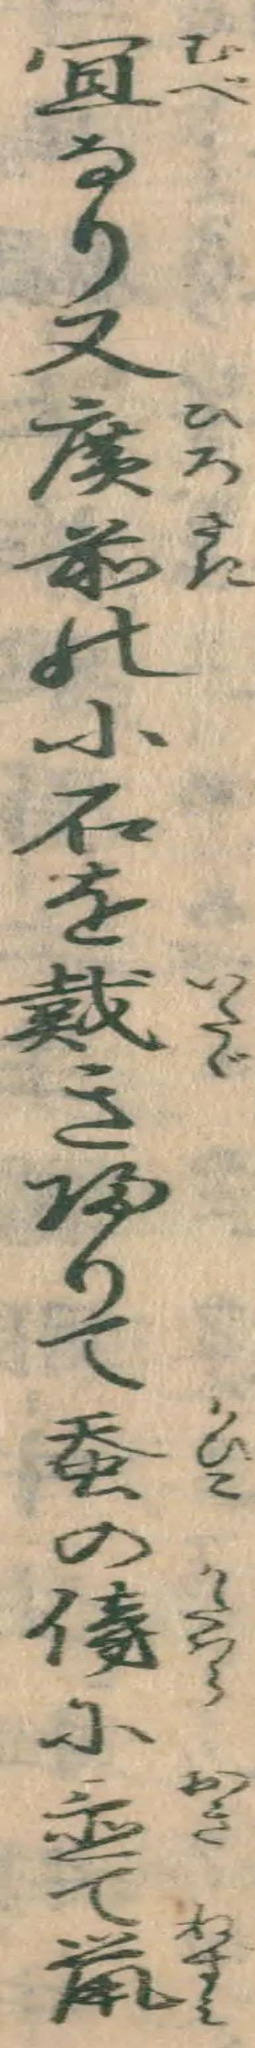冝なり又広前の小石を戴き帰りて蚕の傍に置て鼠
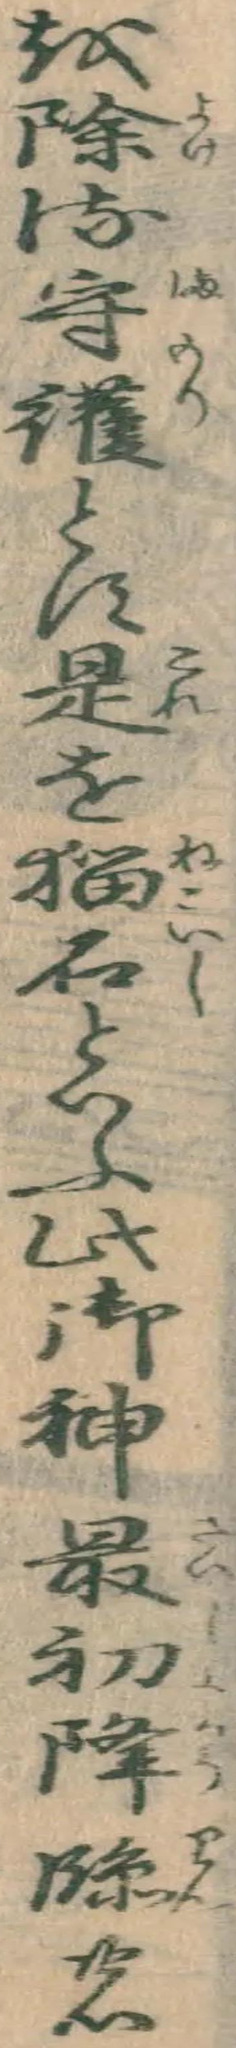を除る守護とす是を猫石といふ此神最初降臨の
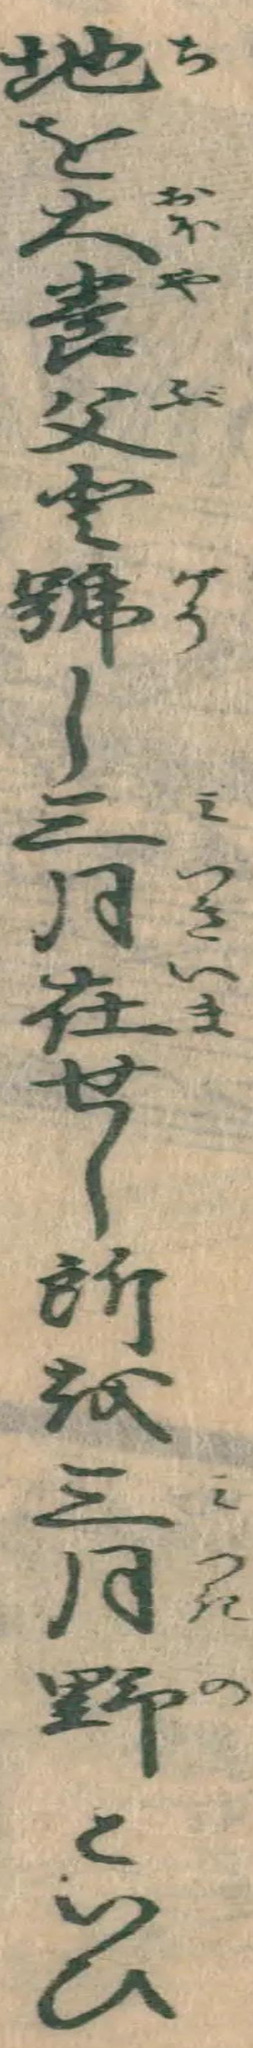地を大養父と号し三月在せし所を三月野といひ
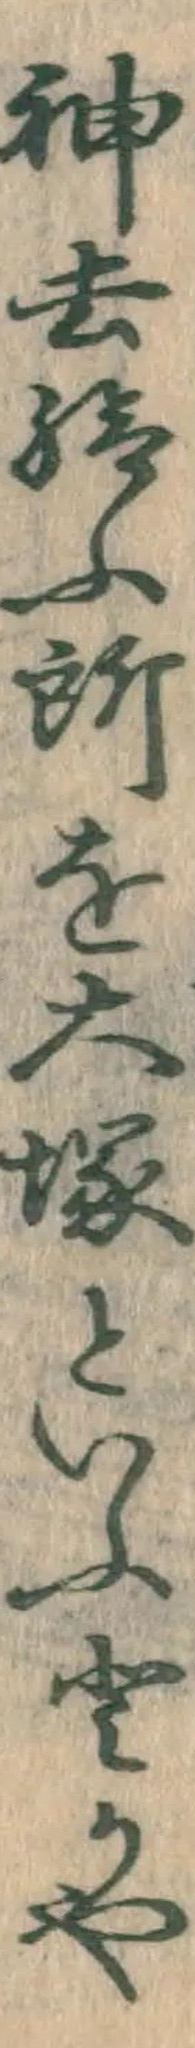神去給ふ所を大塚といふとかや
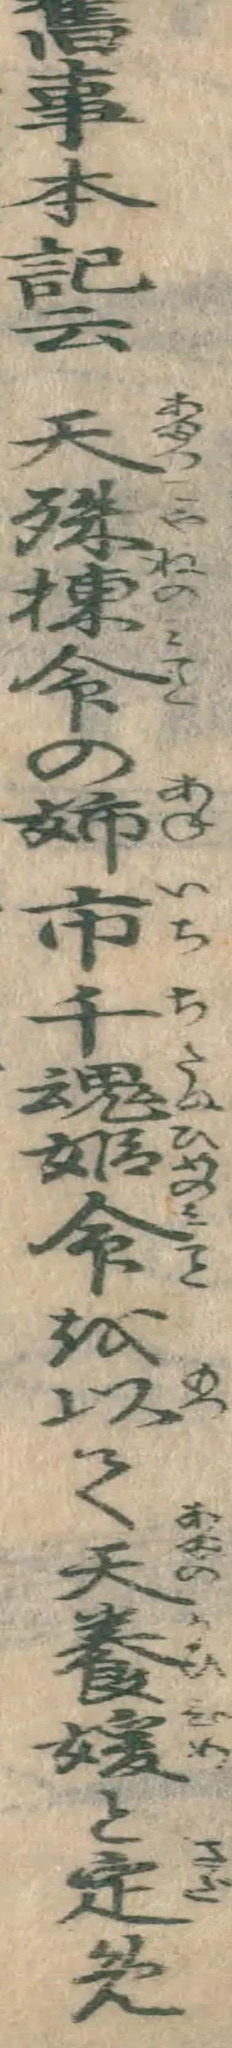旧事本記云天殊棟命の姉市千魂姫を以て天養媛と定め
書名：養蚕秘録 3巻. [1]
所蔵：国立国会図書館 National Diet Library, JAPAN
